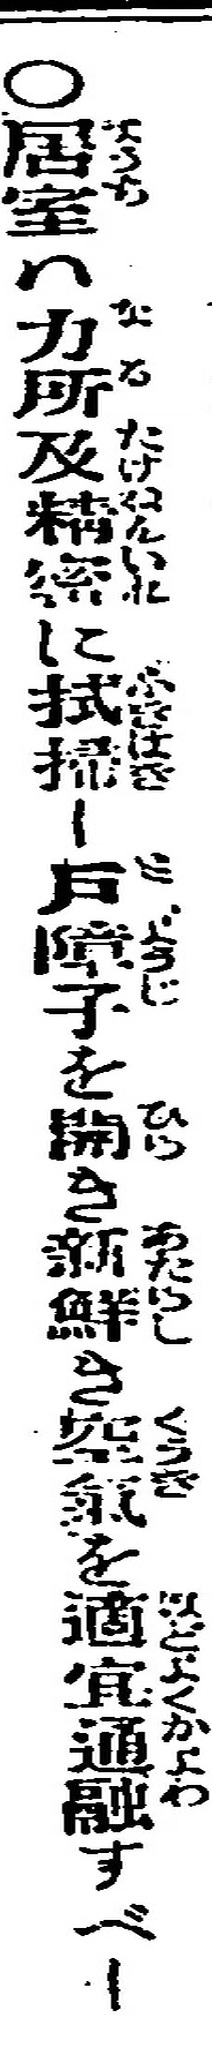〇居室は力所及精密に拭掃し戸障子を開き新鮮き空氣を適宜通融すべし
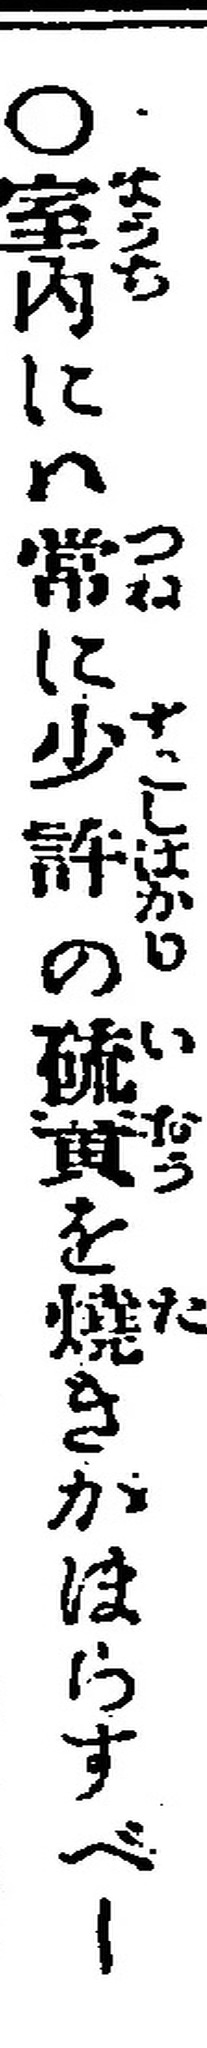〇室内には常に少許の硫黄を焼きかほらすべし
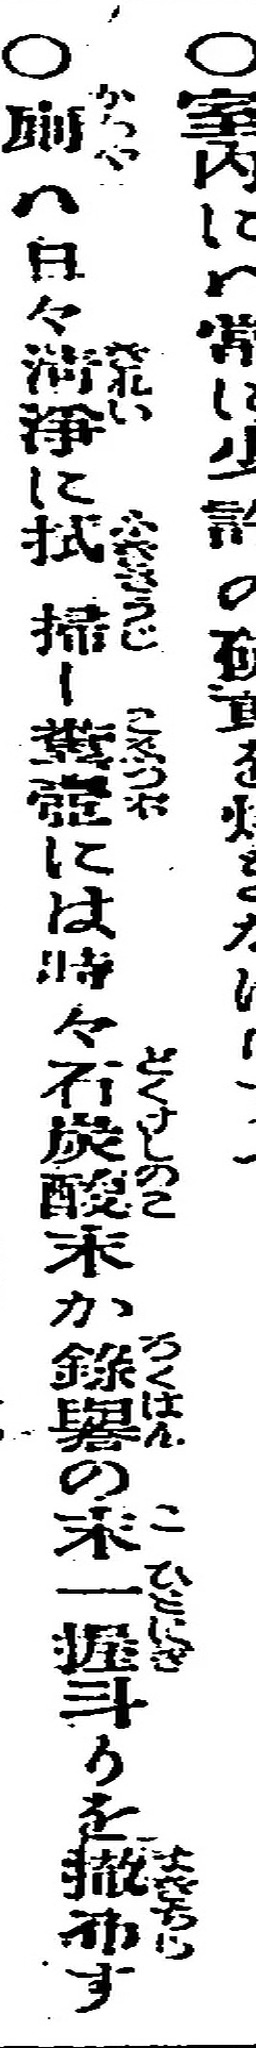〇厠は日々清浄に拭掃し糞壺には時々石炭酸末か録譽の末一握斗りを撤布す
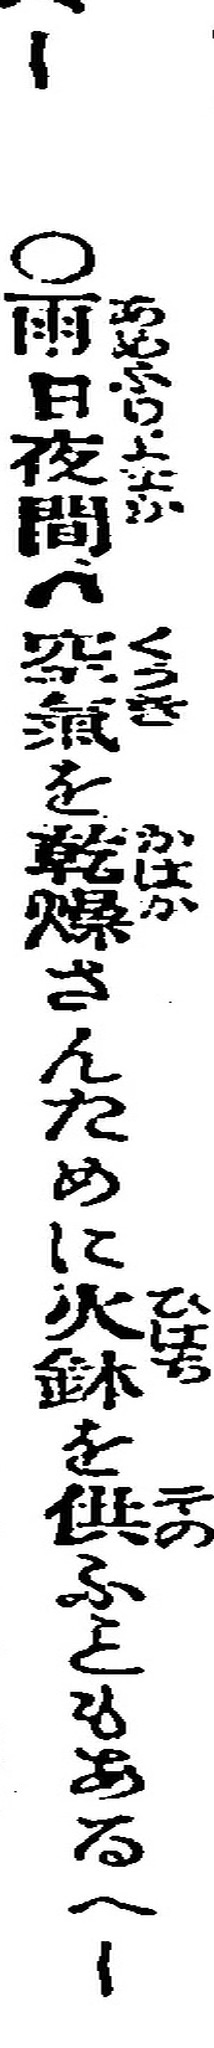べし〇雨日夜間は空氣を乾燥さんために火鉢を供ふこともあるへし
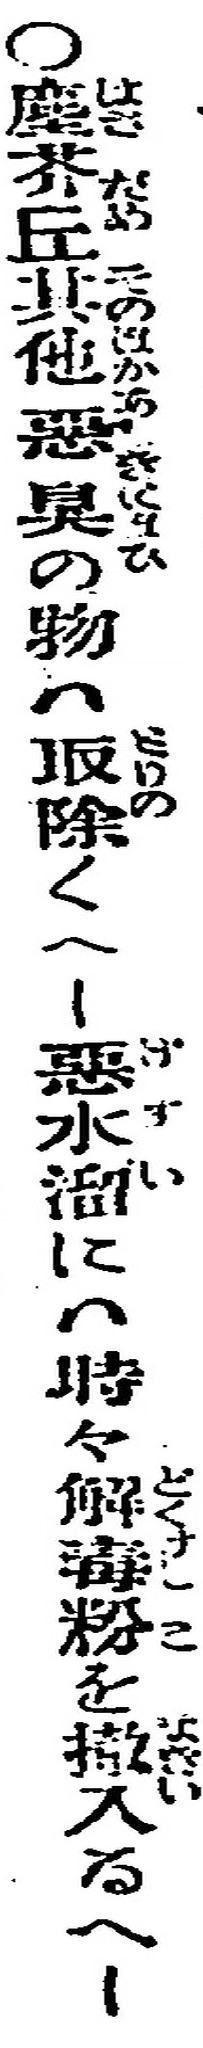〇塵芥丘其他惡臭の物は取除くへし惡水溜には時々解毒粉を撤入るへし
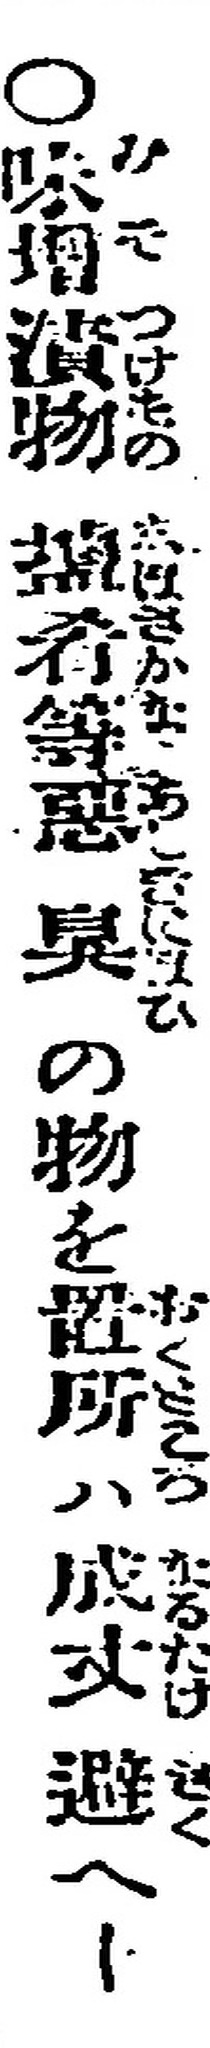〇味噌漬物䀋肴等惡臭の物を置所は成丈避へし
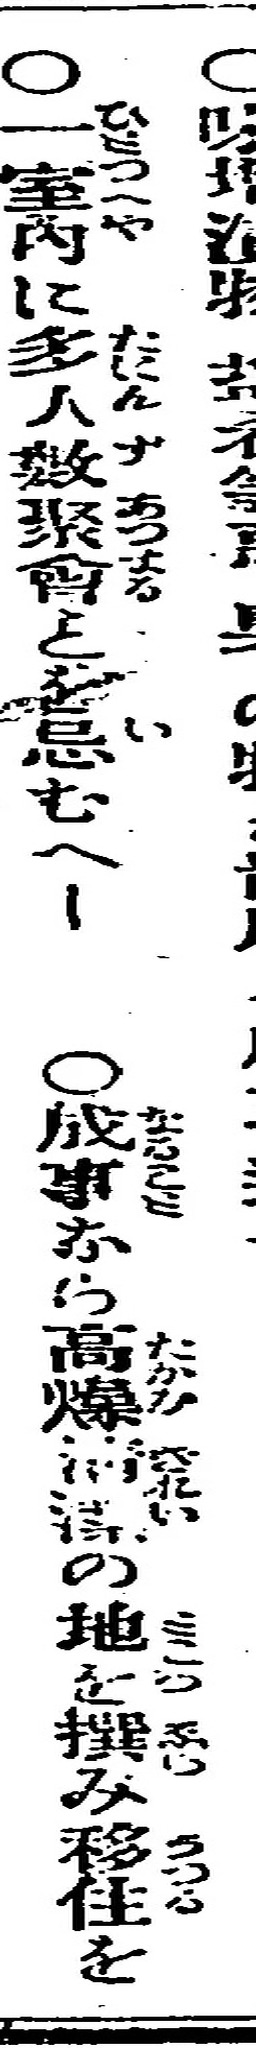〇一室内に多人数聚會ことを忌むへし〇成事なら高燥清潔の地を撰み移住を
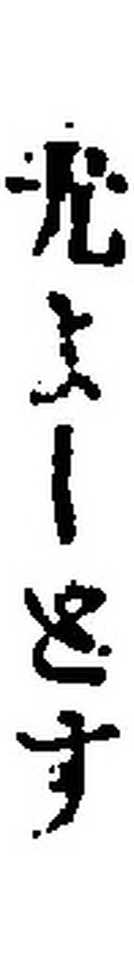尤よしとす
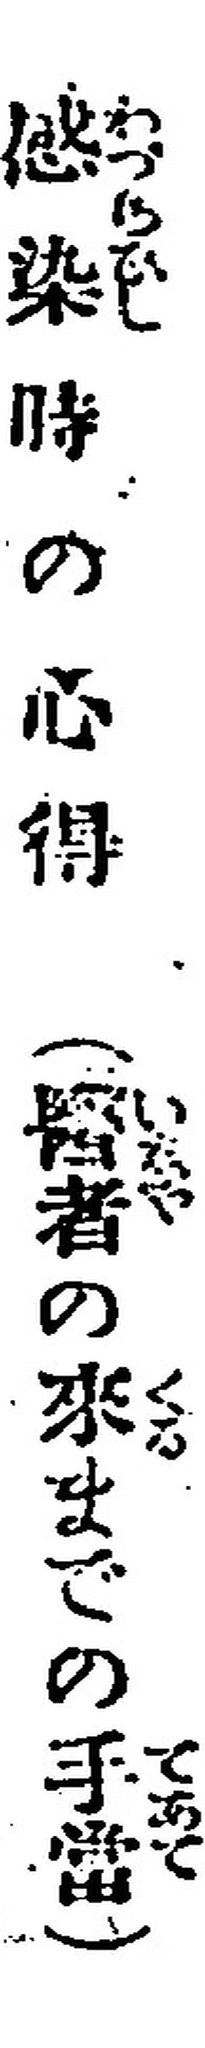感染時の心得[醫者の來までの手當]
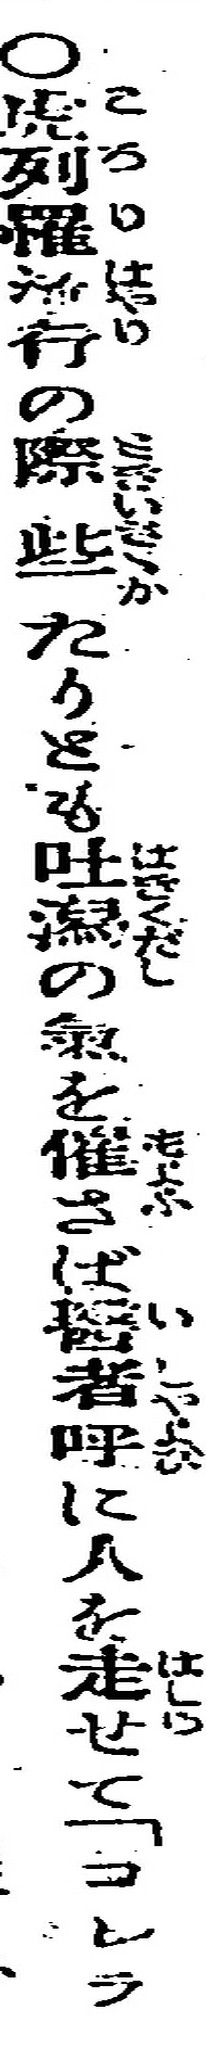〇虎列刺流行の際些たりとも吐瀉の氣を催さば醫者呼に人を走せて「コレラ
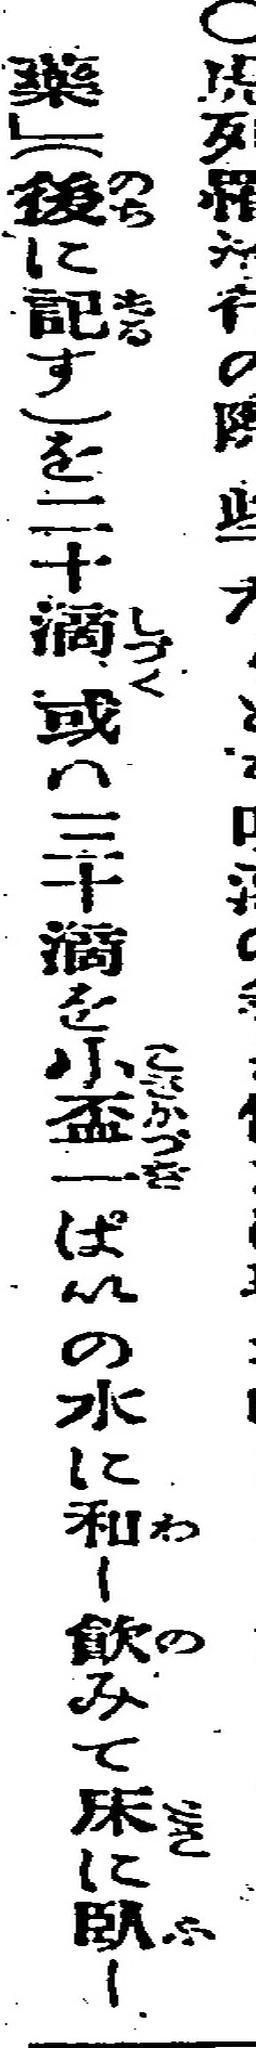藥」[後に記す]を二十滴或は三十滴を小盃一ぱいの水に和し飲みて床に伏し
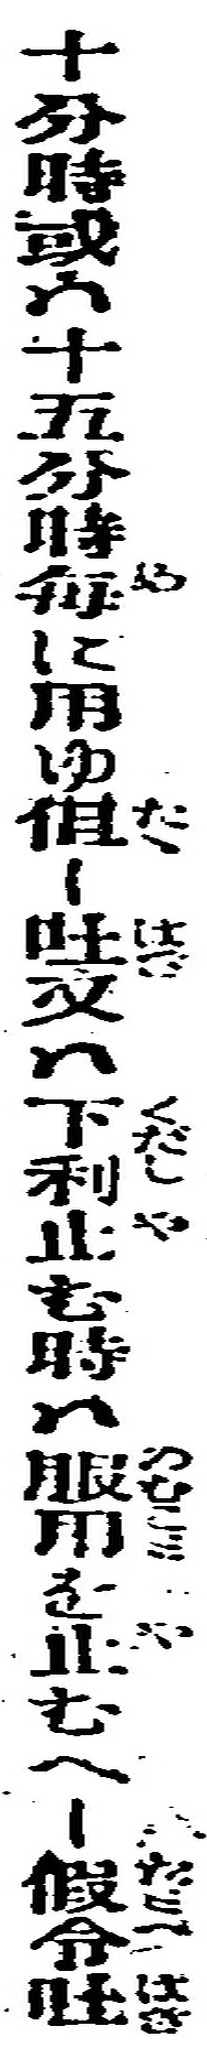十分時或は十五分時毎に用ゆ但し吐又は下利止む時は服用を止むへし假令吐
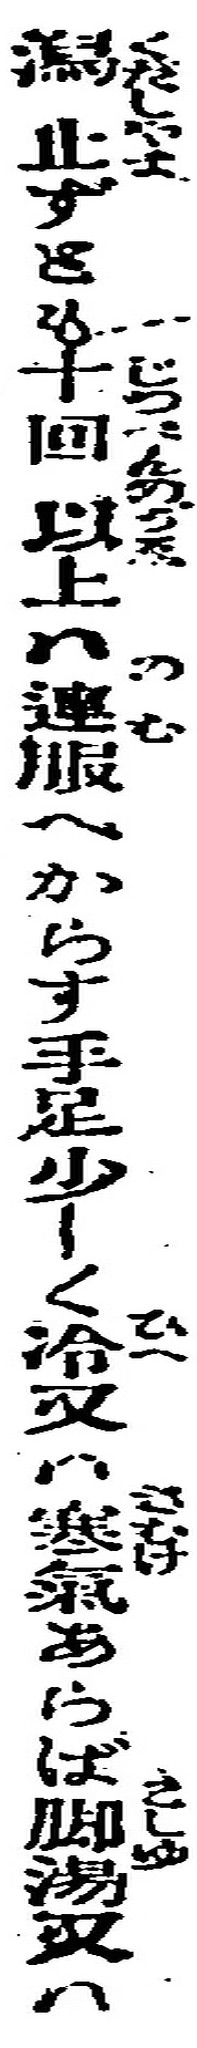瀉止ずとも十回以上は進服へからす手足少しく冷又は寒氣あらば脚湯又は
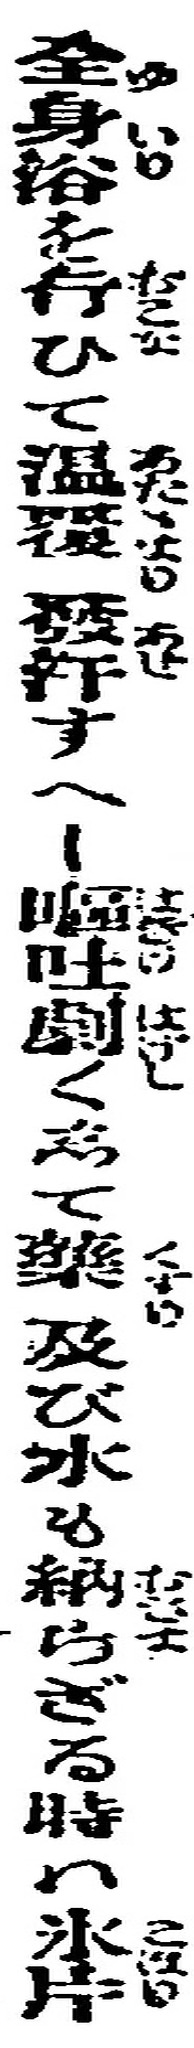全身浴を行ひて温覆發汗すへし嘔吐劇くして藥及び納らざる時は氷片
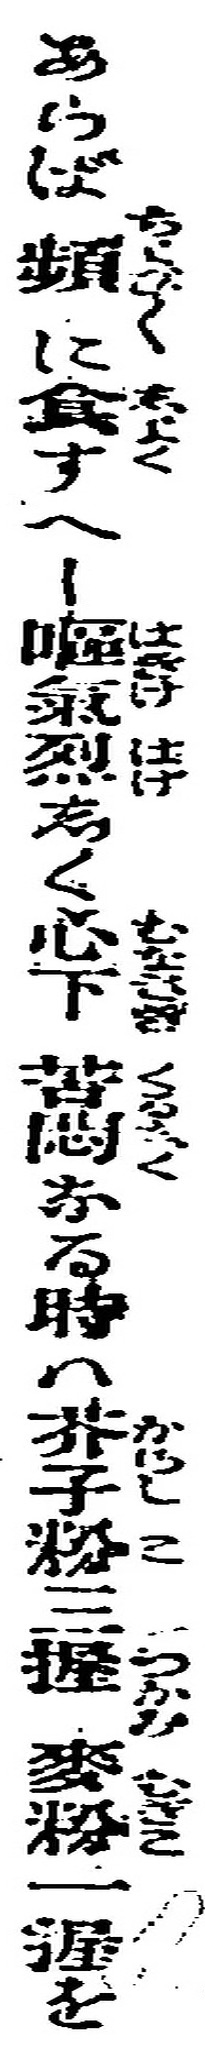あらば頻に食すへし嘔氣烈しく心下苦悶なる時は芥子粉三握麥粉一握を
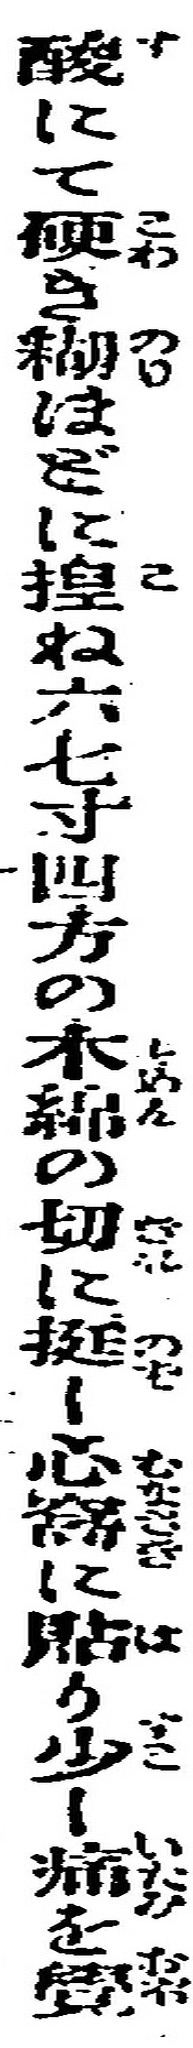酸にて硬き糊ほどに捏ね六七寸四方の木綿の切に挺し心窩に貼り少し痛を覚
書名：虎列剌病予防養生法訳解
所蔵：国立国会図書館 National Diet Library, JAPAN
